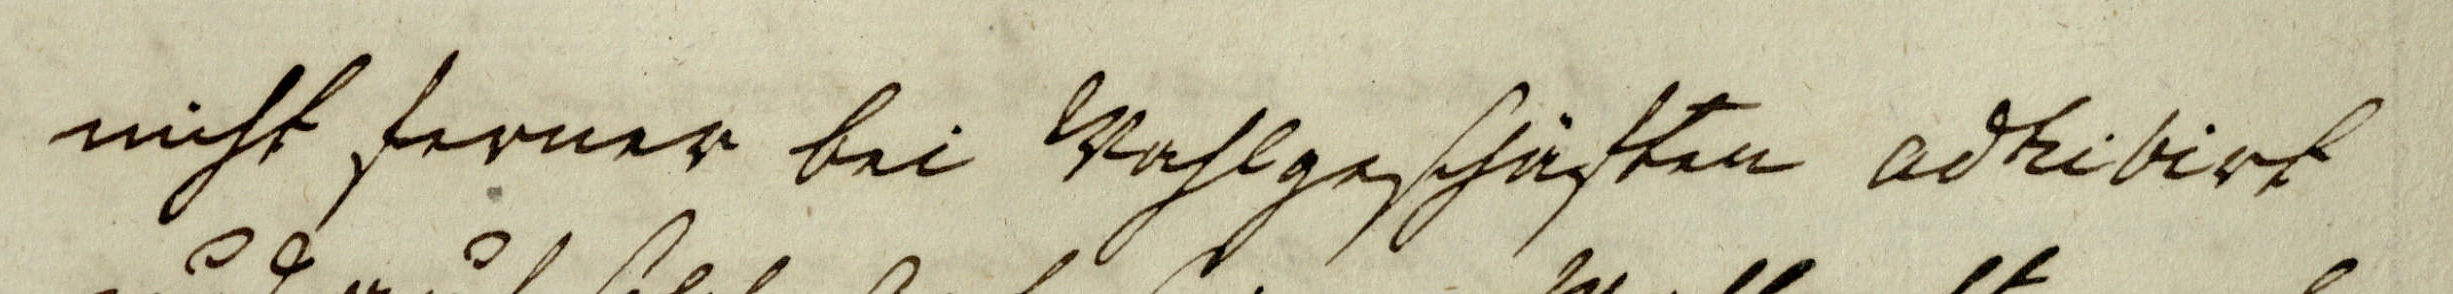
nicht ferner bei Wahlgeschäften adhibirt
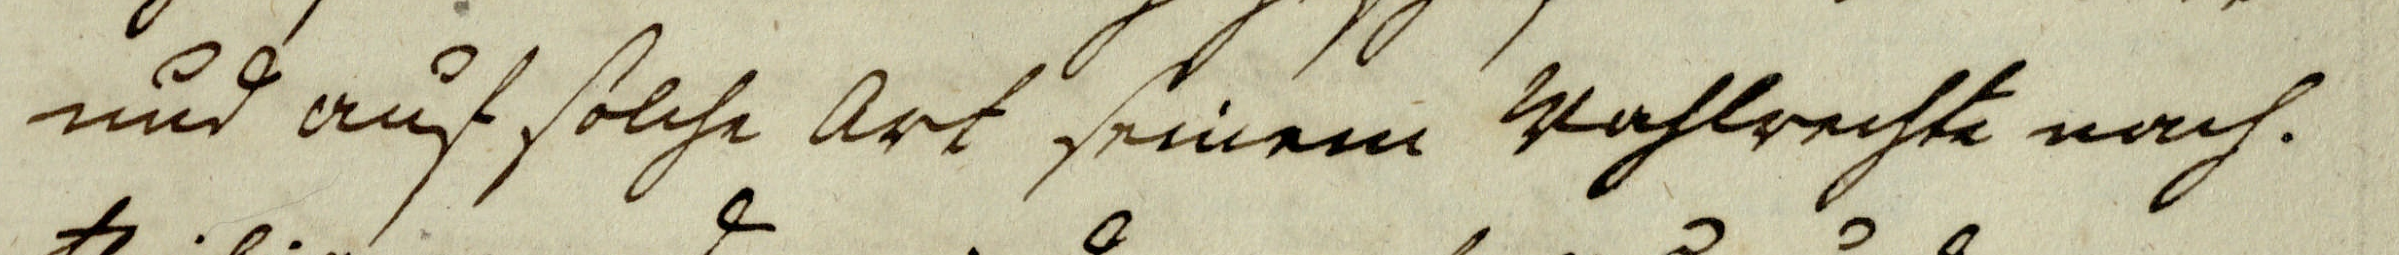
und auf solche Art seinem Wahlrechte nach
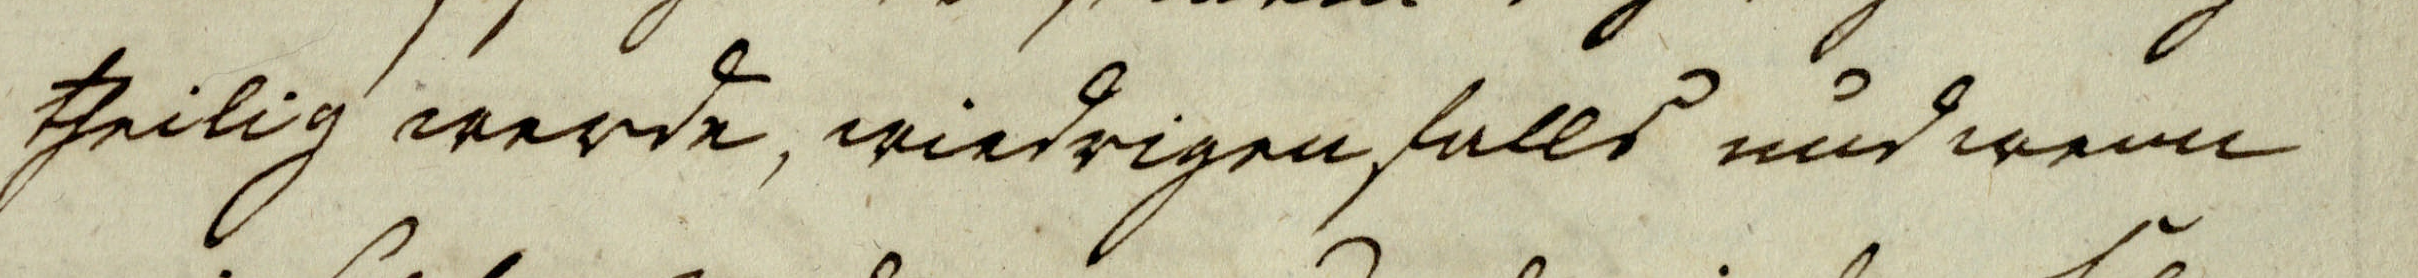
theilig werde, wiedrigenfalls und wenn
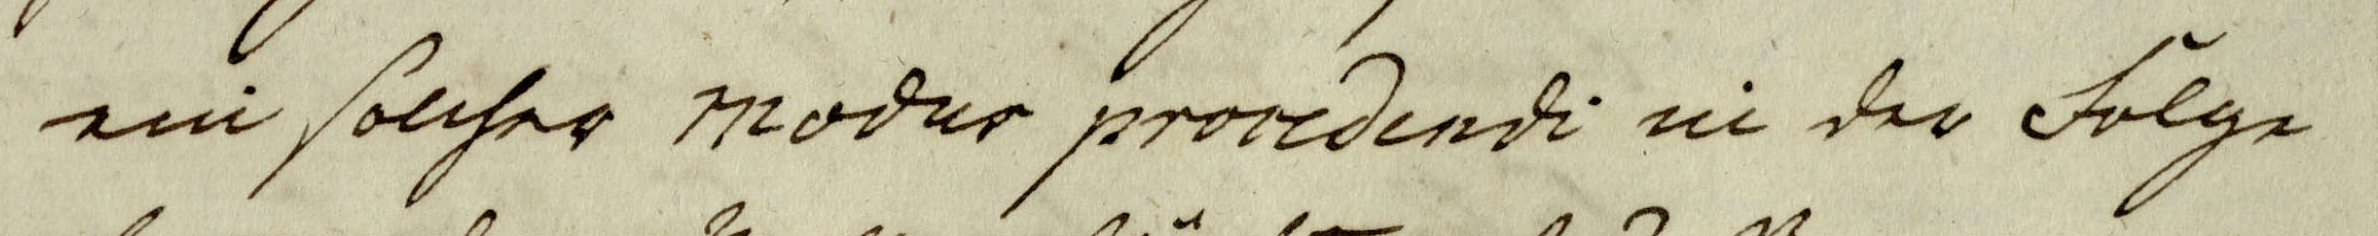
ein solcher modus procedendi in der Folge
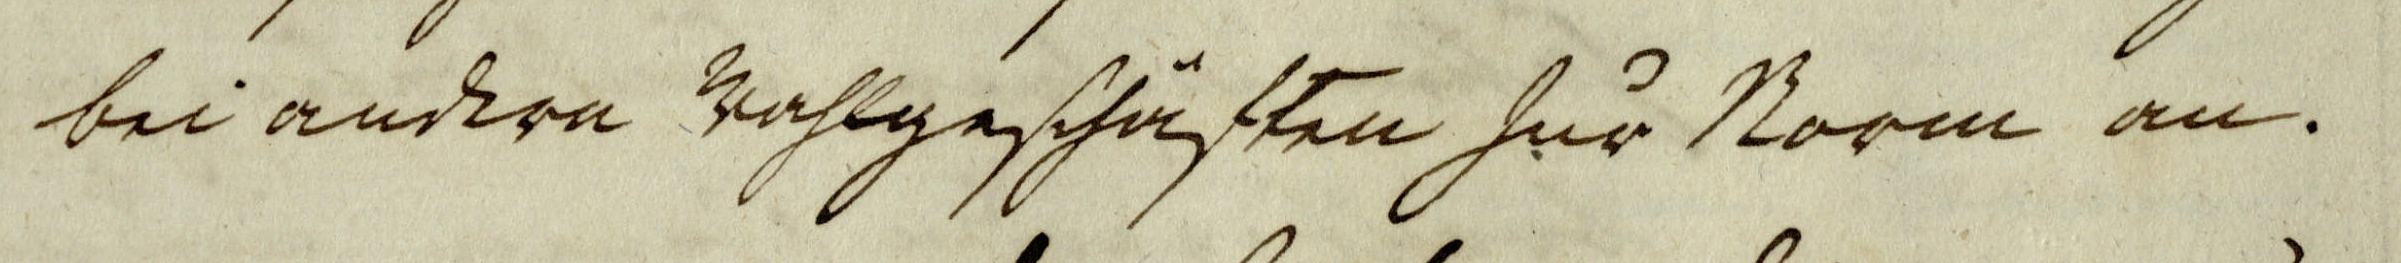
bei andern Wahlgeschäften zur Norm an¬
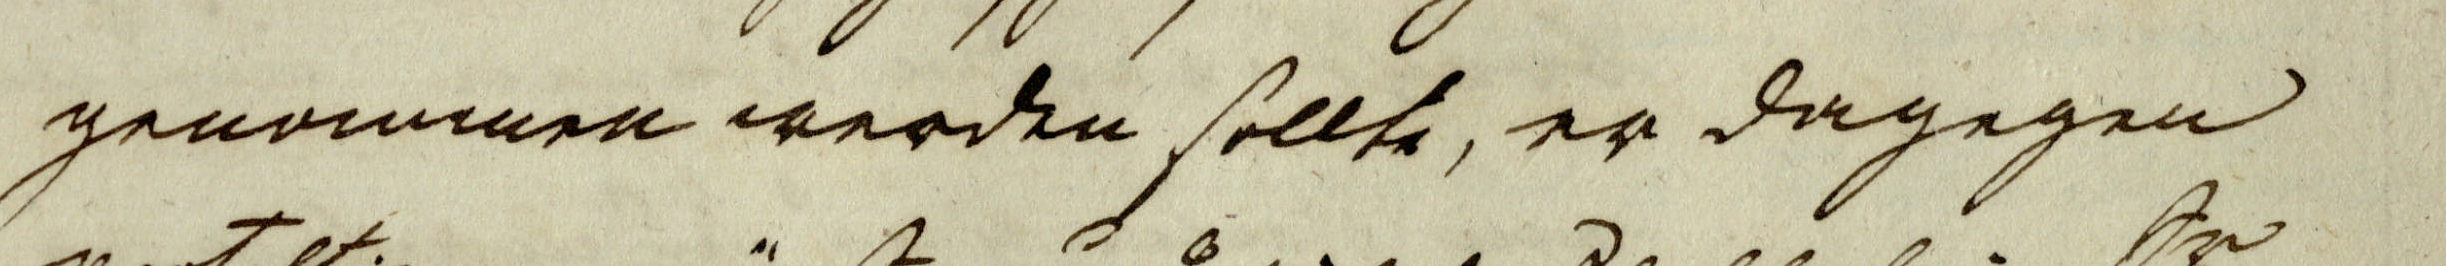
genommen werden sollte, er dagegen
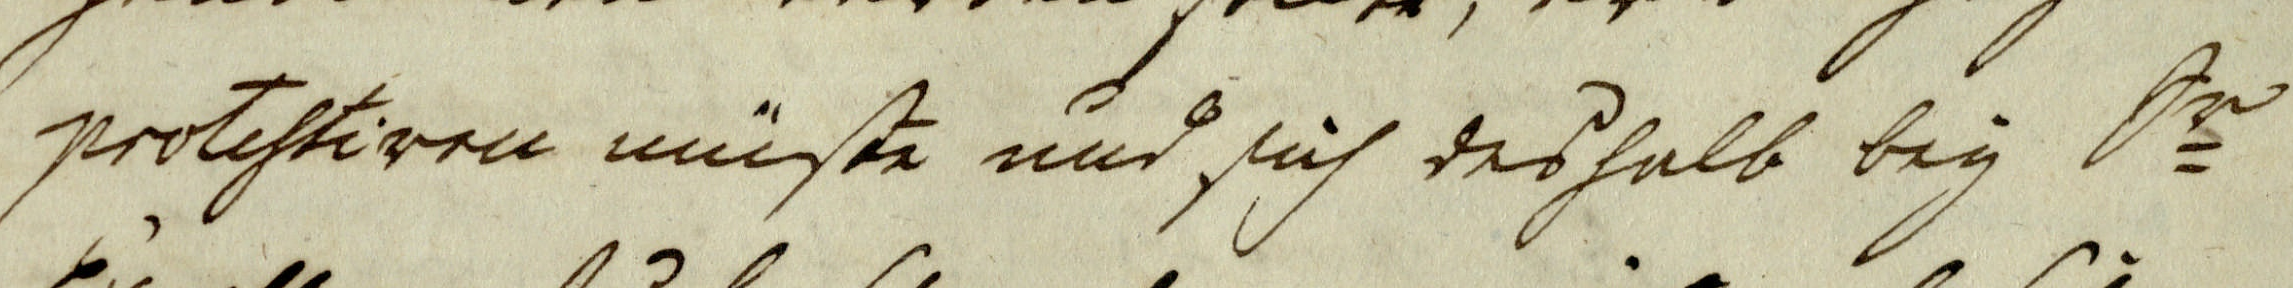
protestiren müßte und sich deshalb beÿ Sr
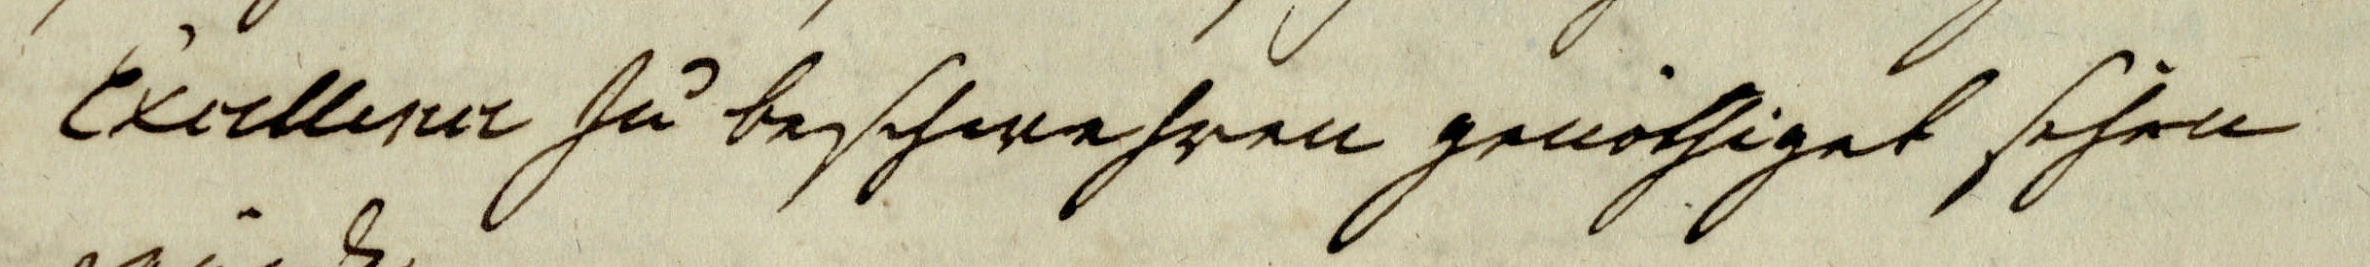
Excellence zu beschwehren genöthiget sehen
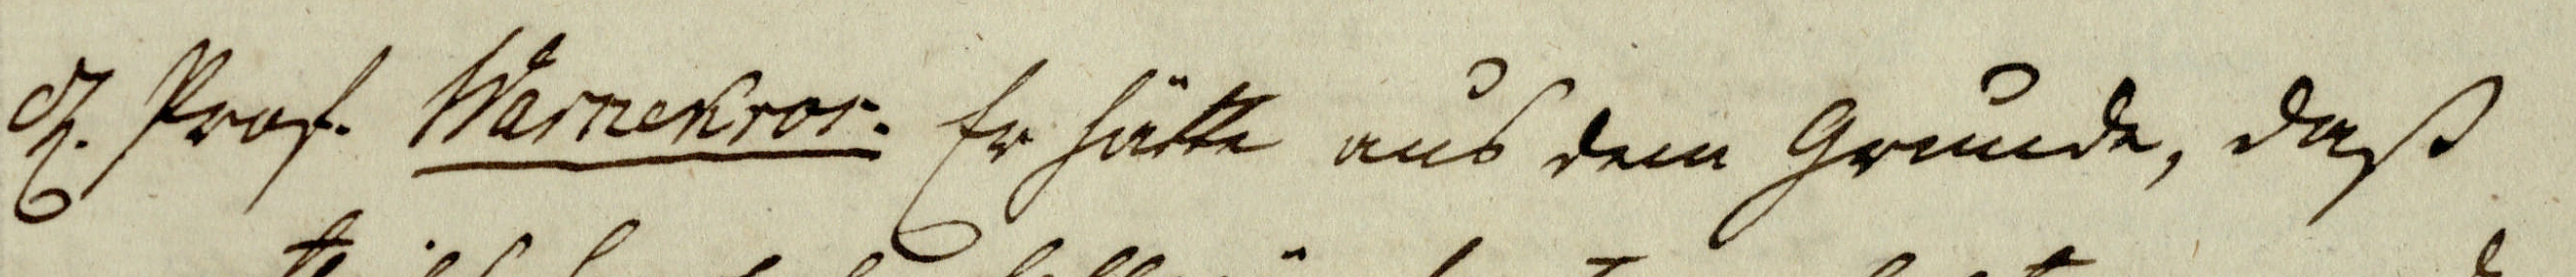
dh. Prof. Warnekros. Er hätte aus dem Grunde, daß
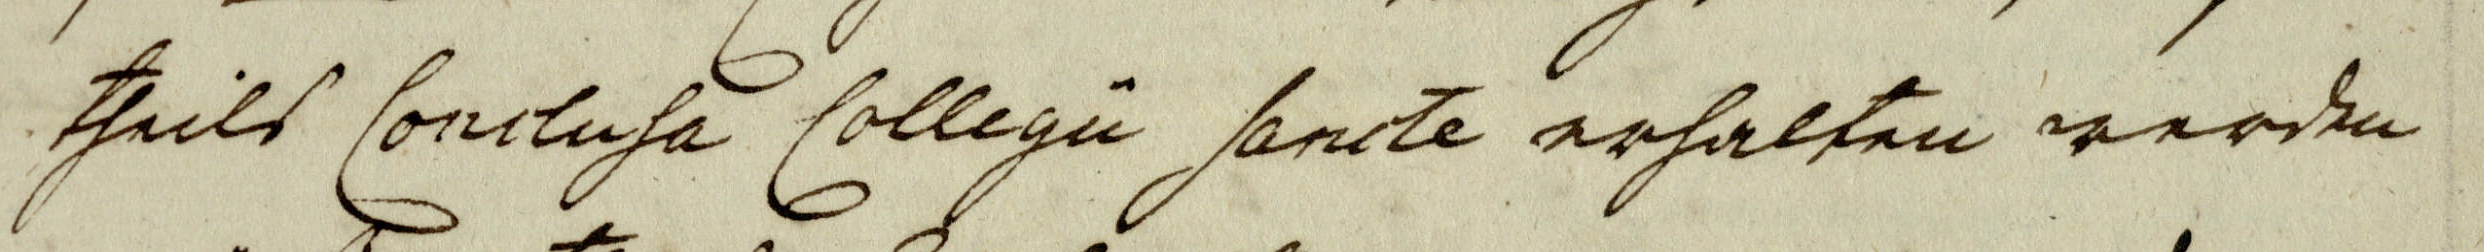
theils Conclusa Collegii sancte erhalten werden
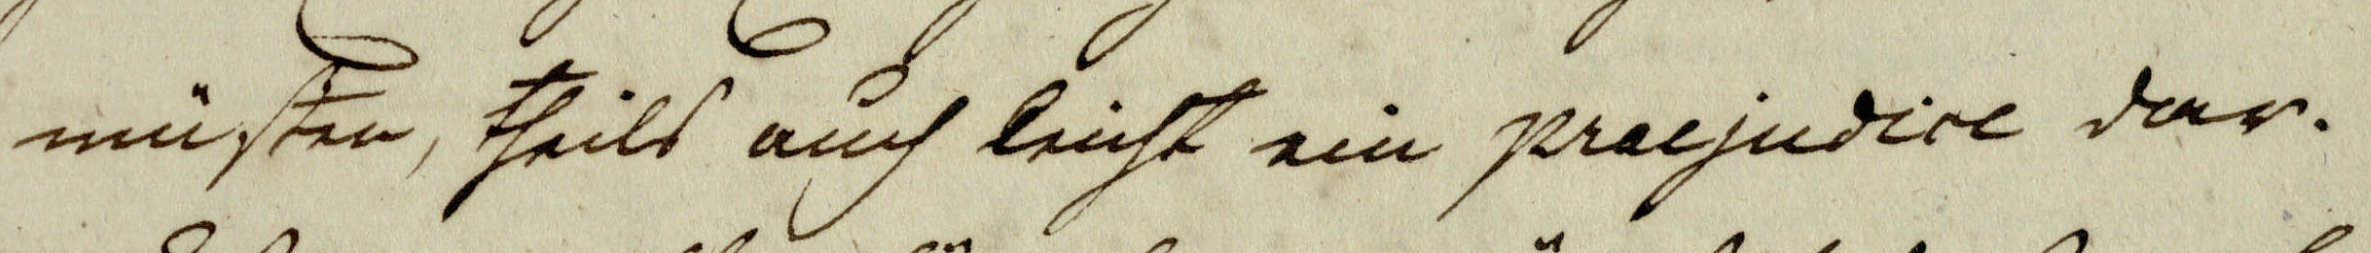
müßten, theils auch leicht ein praejudice dar¬
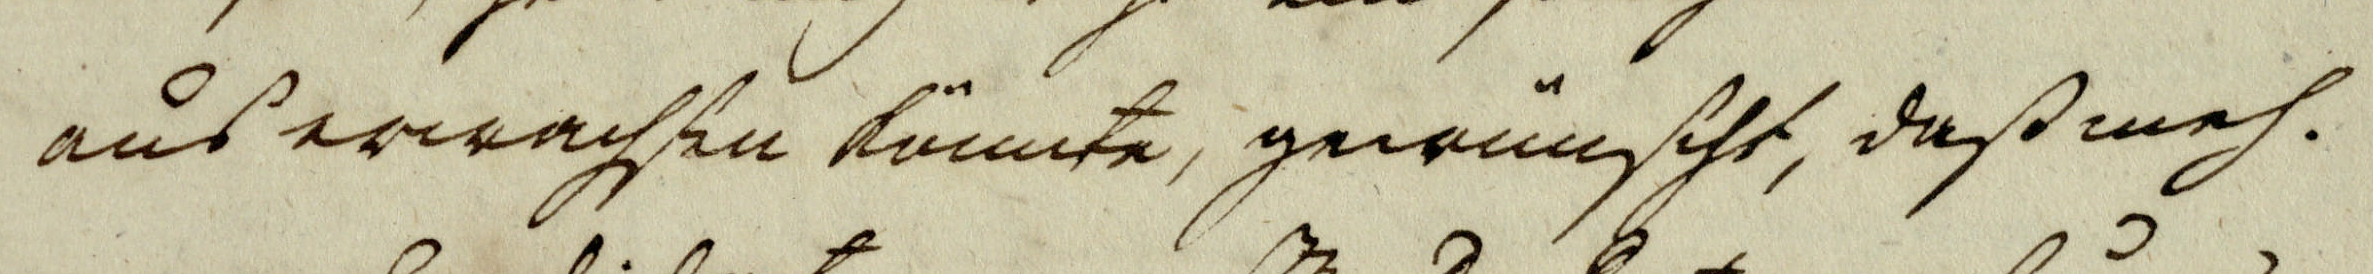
aus erwachsen könnte, gewünscht, daß meh¬
